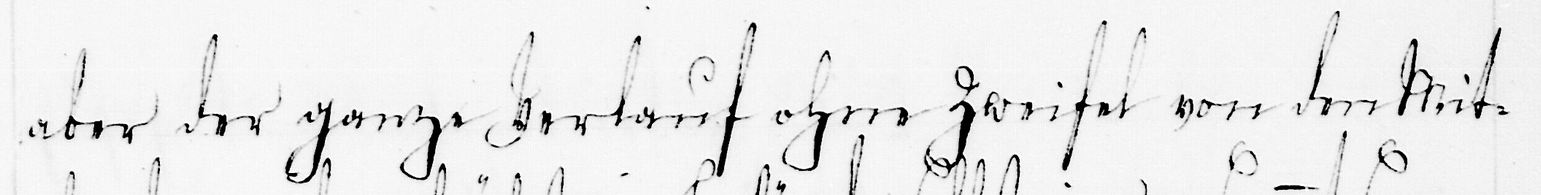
aber der ganze Verlauf ohne Zweifel von den Mit¬
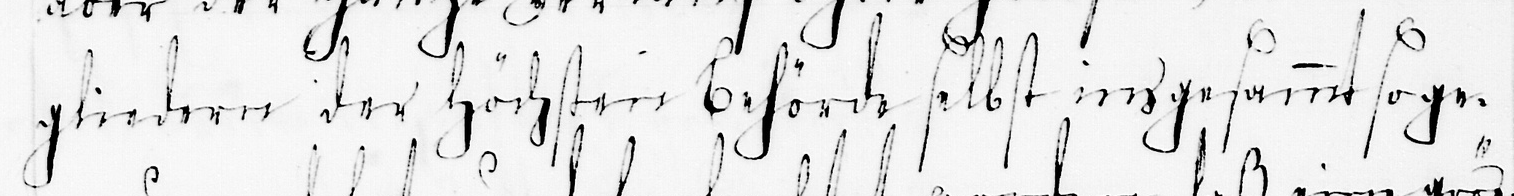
gliedern der höchsten Behörde selbst insgesammt so ge¬
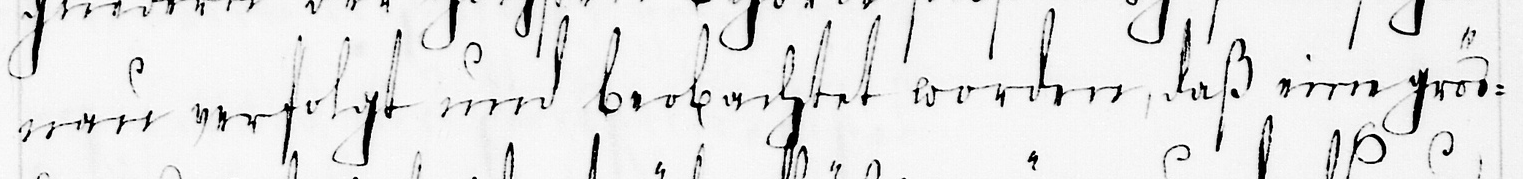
nau verfolgt und beobachtet worden, daß eine grö¬
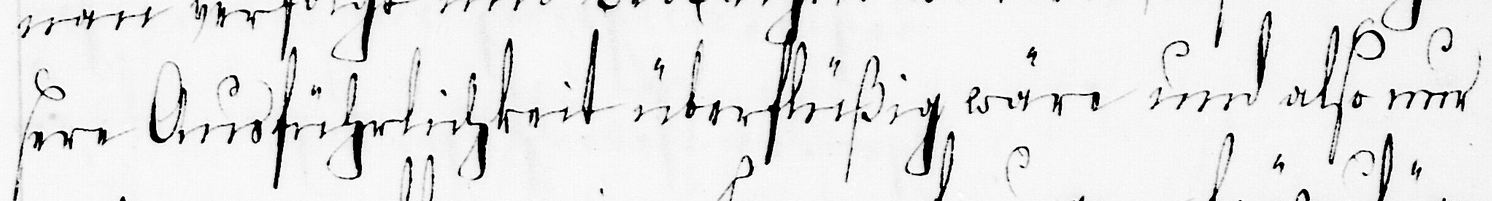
ßere Ausführlichkeit überflüßig wäre und also nur
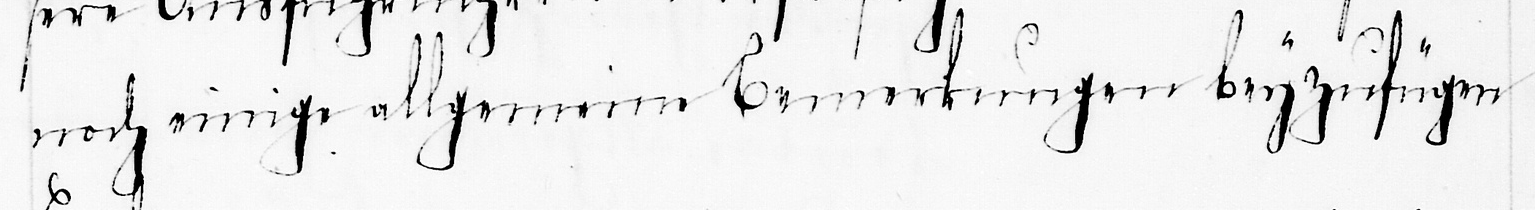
noch einige allgemeine Bemerkungen beyzufügen
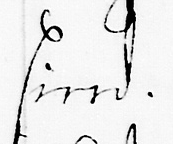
sind.
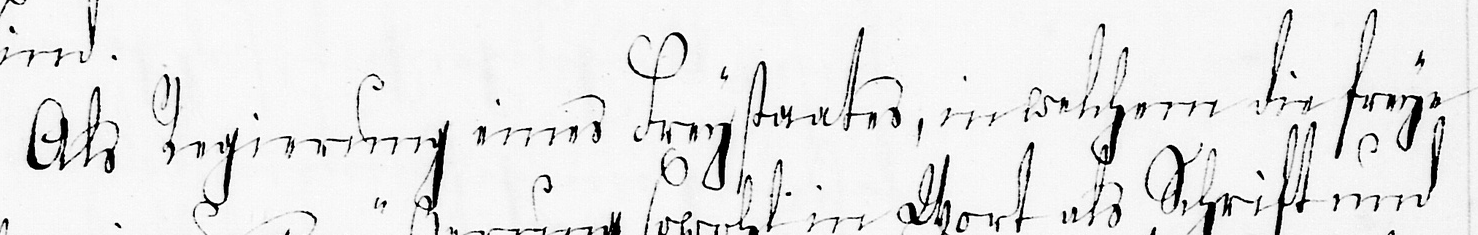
Als Regierung eines Freystaates, in welchem die freye
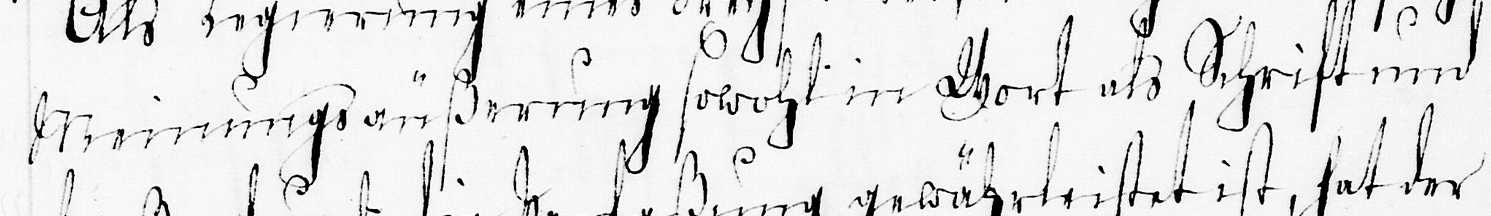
Meinungsäußerung sowohl in Wort als Schrift und
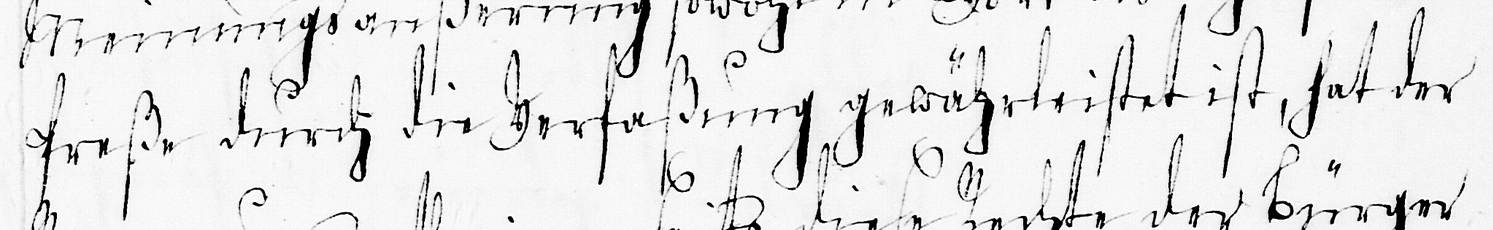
Preße durch die Verfaßung gewährleistet ist, hat der
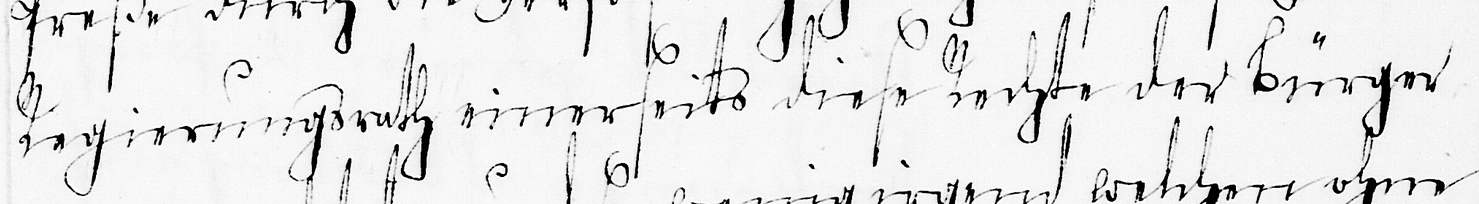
Regierungsrath einerseits diese Rechte der Bürger
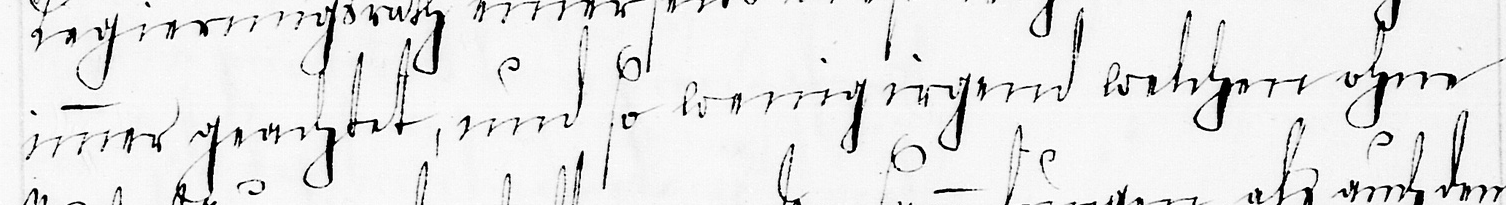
immer geachtet, und so wenig irgend welchen ohne
